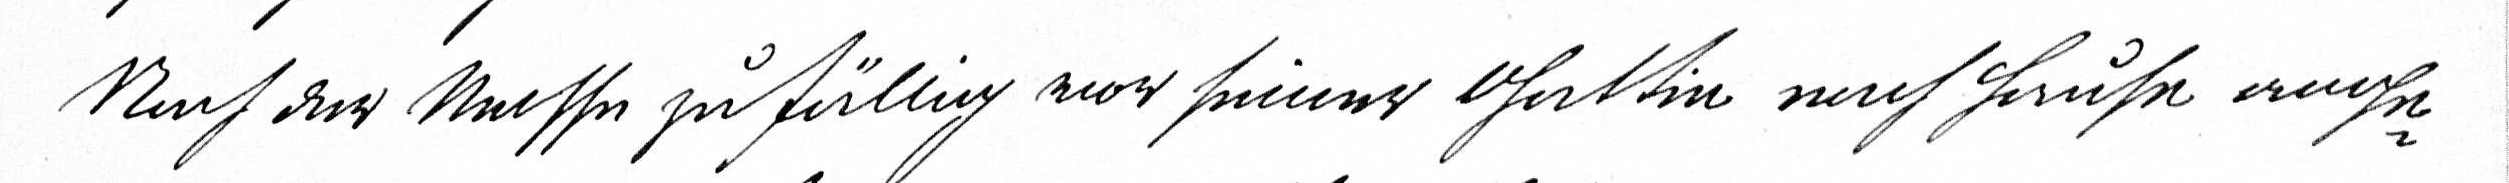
Nach der Messe zufällig vor seiner Gattin nach Hause ange¬
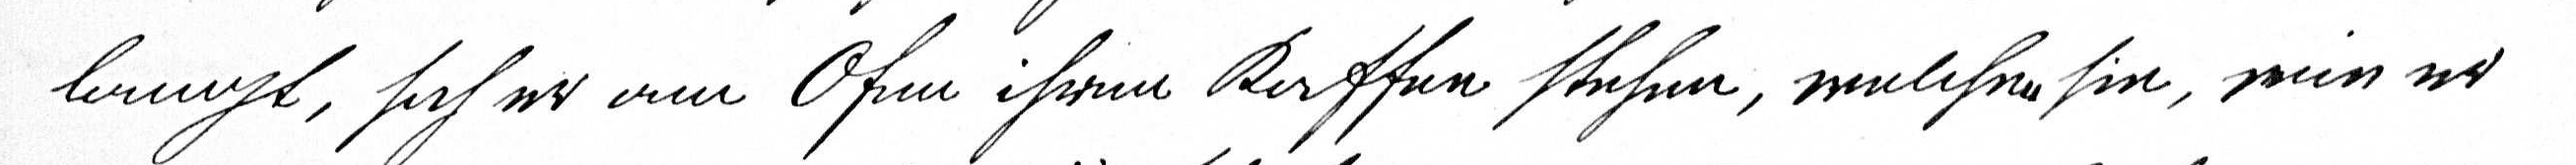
langt, sah er am Ofen ihren Kaffee stehen, welchen sie, wie er
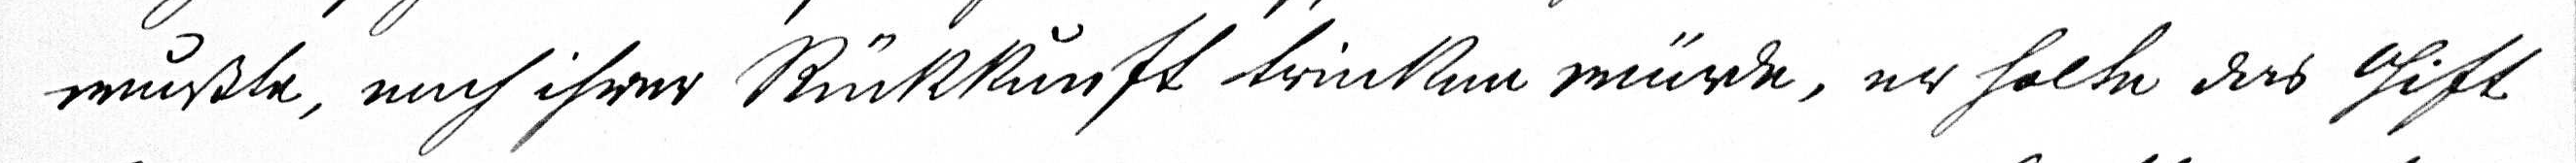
wußte, nach ihrer Rückkunft trinken würde, er holte das Gift
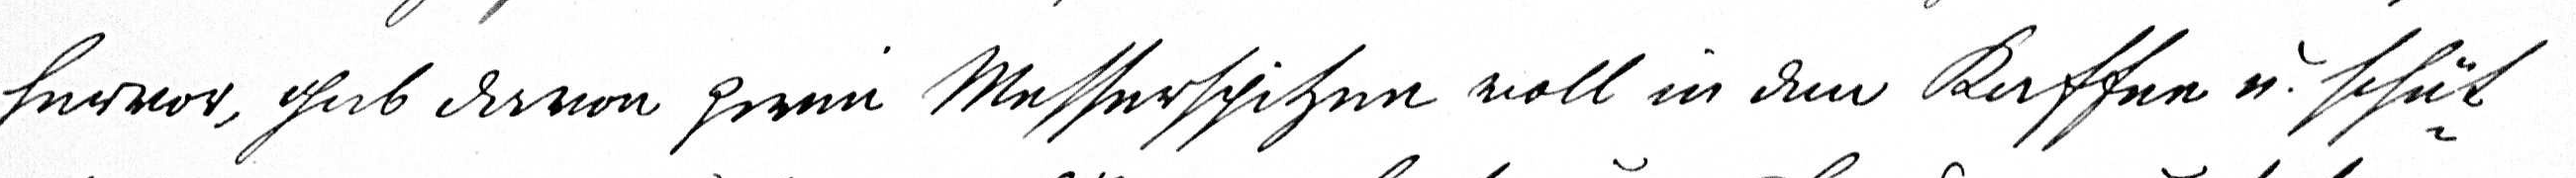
hervor, gab davon zwei Messerspitzen voll in dem Kaffee u schüt¬
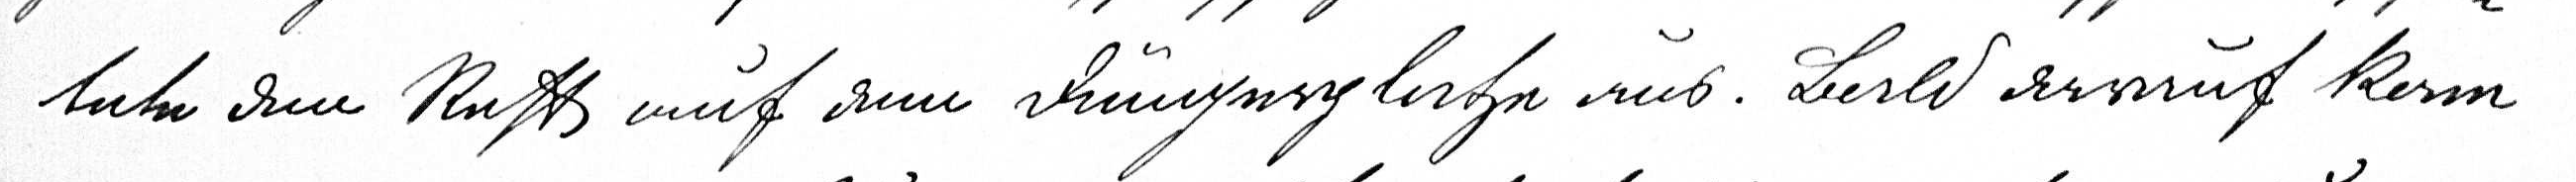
tete de Rest auf dem Düngerplatze aus. Bald darauf kam
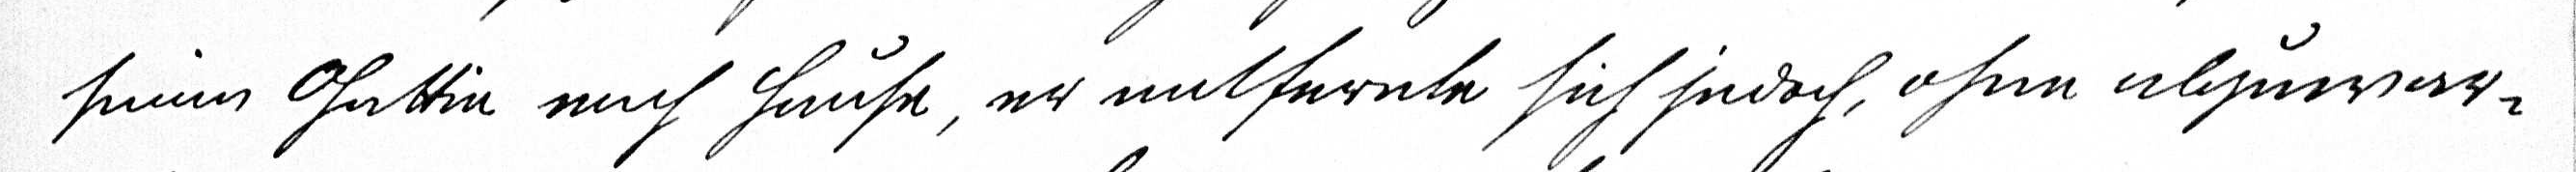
seine Gattin nach Hause, er entfernte sich jedoch, ohne abzuwar¬
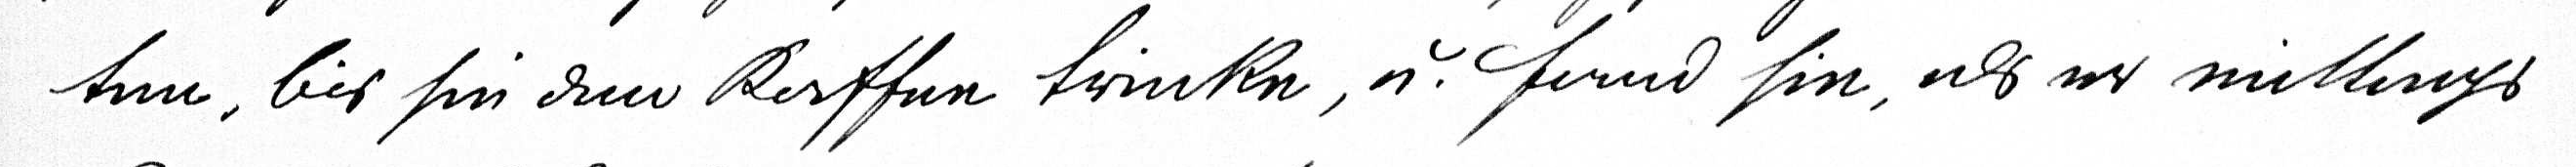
ten, bis sie den Kaffee trinke, u. fand sie, als er mittags
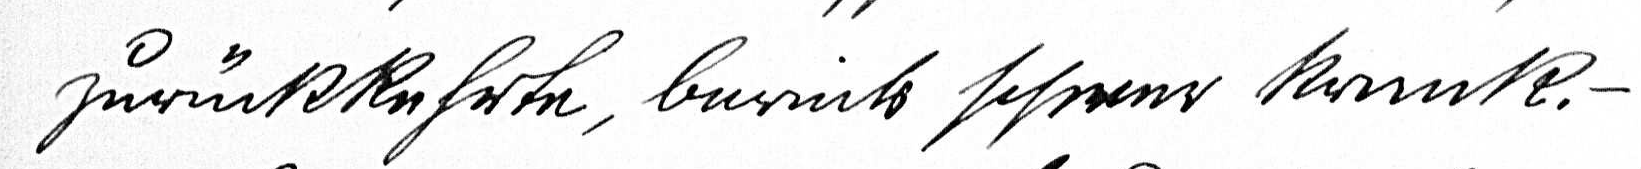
zurückkehrte, bereits schwer krank.
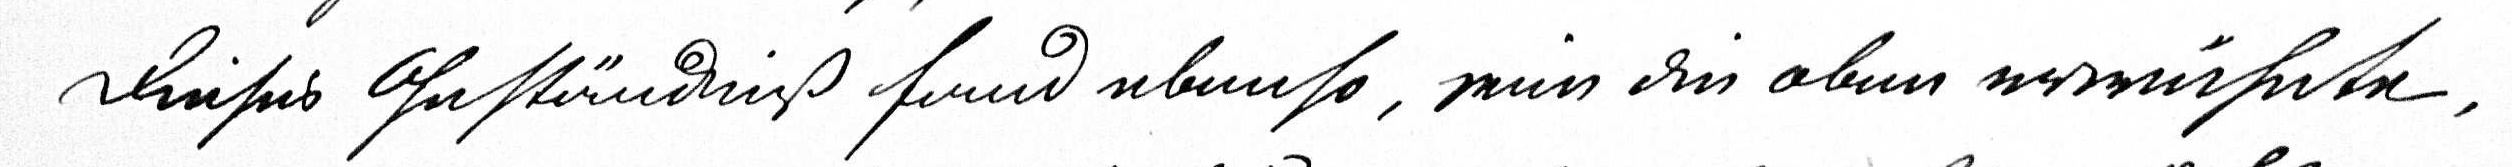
Dieses Geständniß fand ebenso, wie die oben erwähnte,
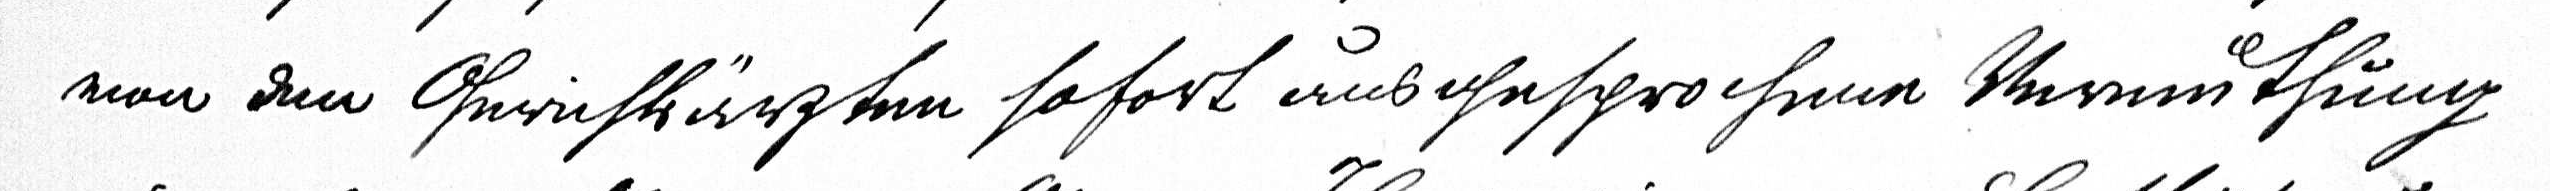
von den Gerichtsärzten sofort ausgesprochene Vermuthung
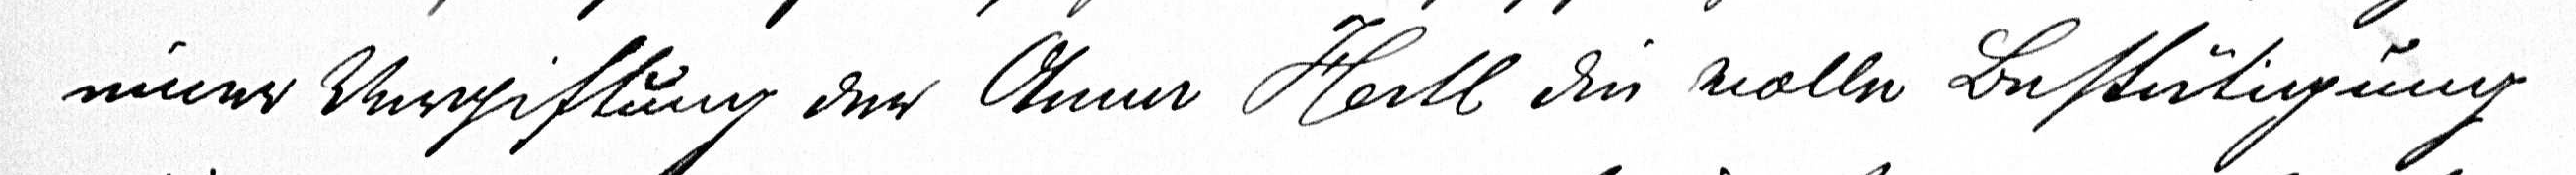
einer Vergiftung der Anna Hertl die volle Bestätigung
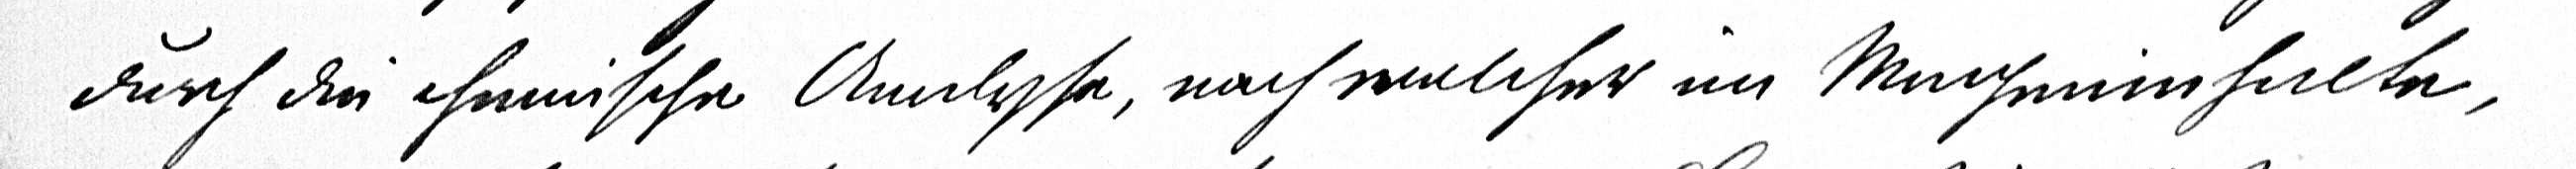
durch die chemische Analyse, nach welcher im Mageninhalte,
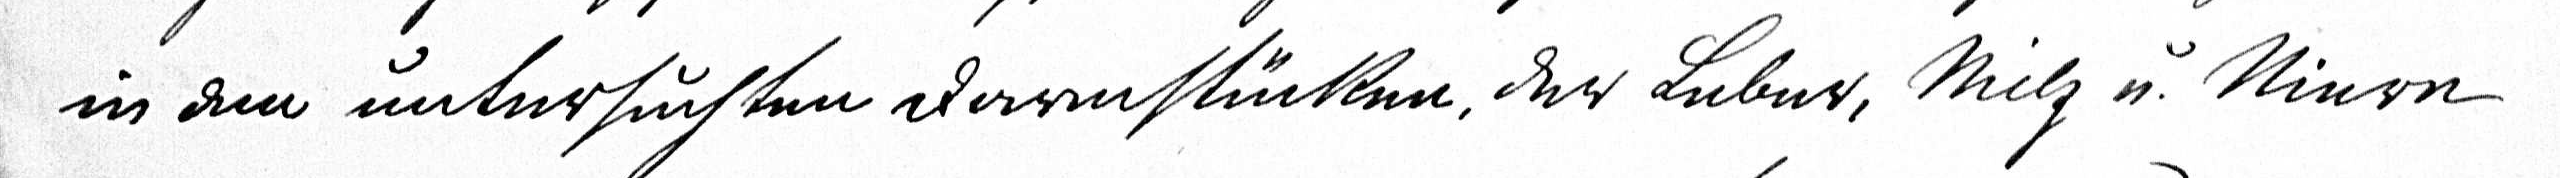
in den untersuchten Darmstücken, der Leber, Milz un Niere
